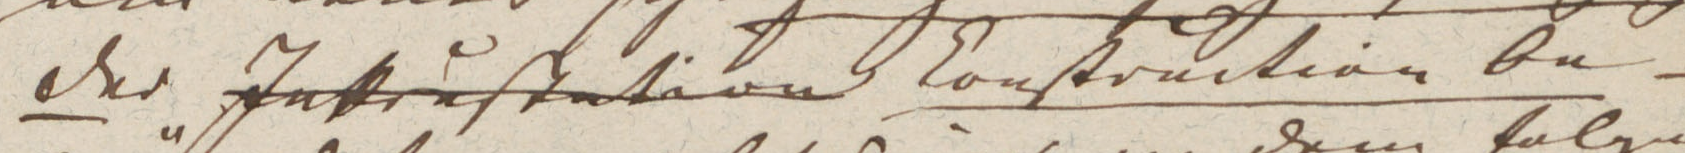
der Inkrustation Construction be-
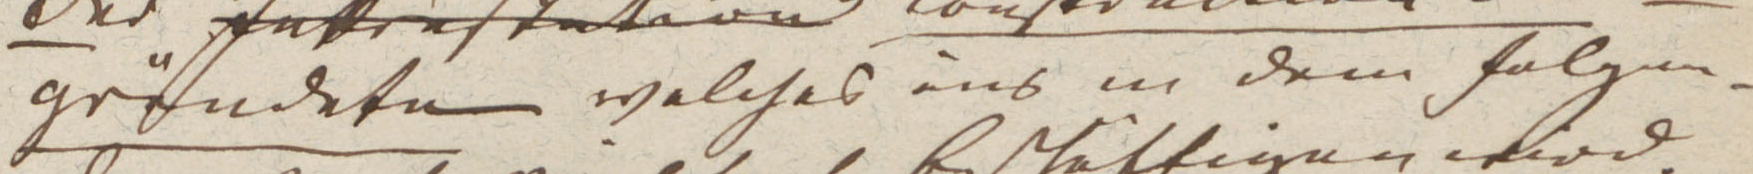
gründete welches uns in dem Folgen-
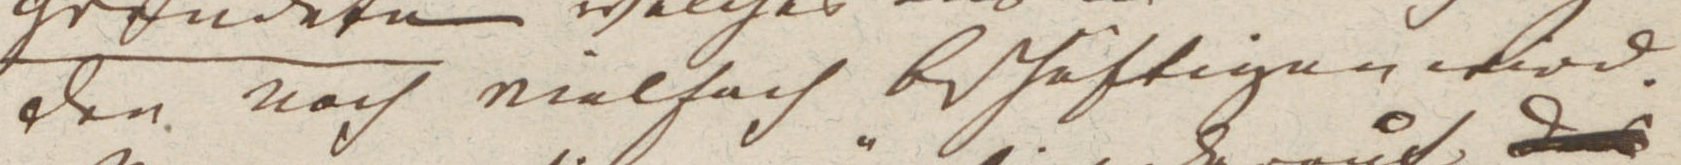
den noch vielfach beschäftigen wird.
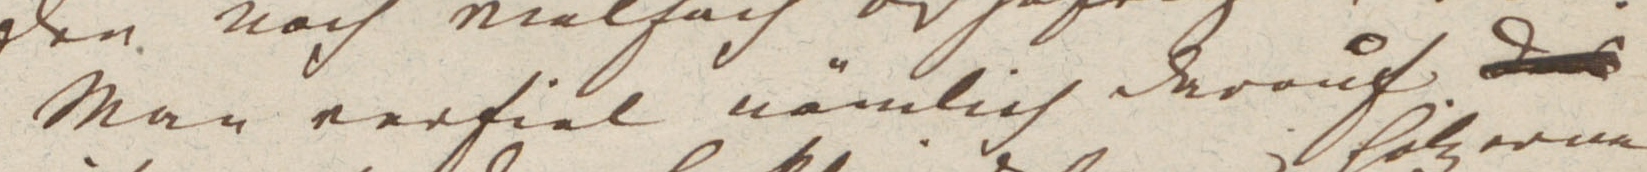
Man verfiel nämlich darauf das
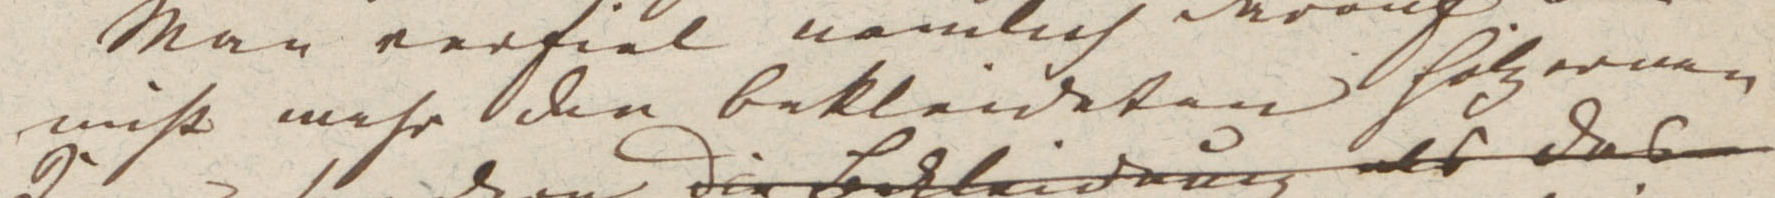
nicht mehr den bekleideten hölzernen
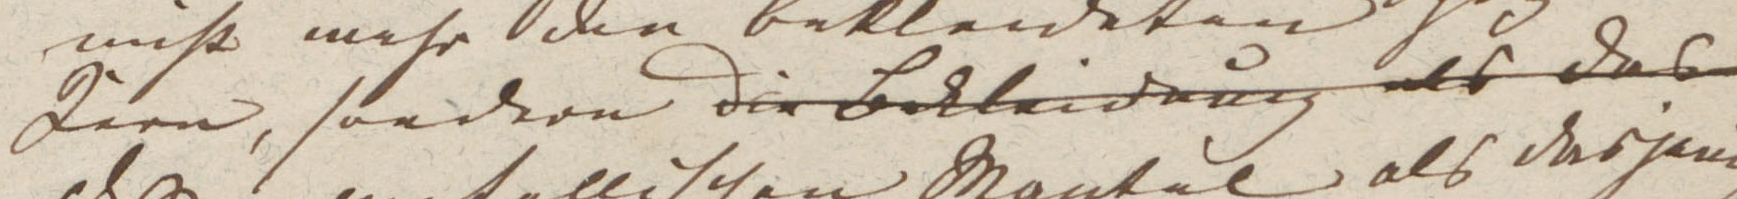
Kern, sondern die Bekleidung als das
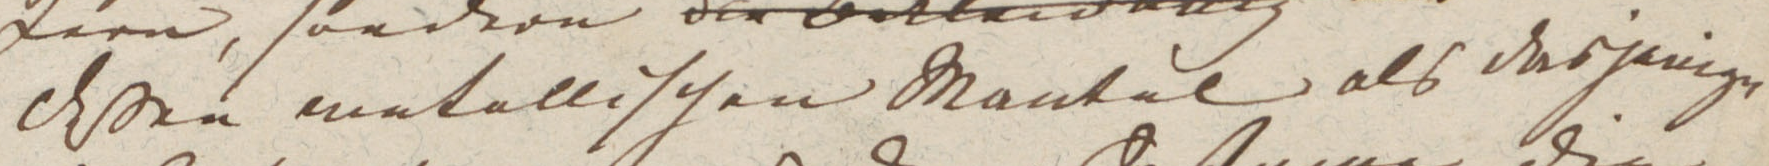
dessen metallischen Mantel als dasjenige
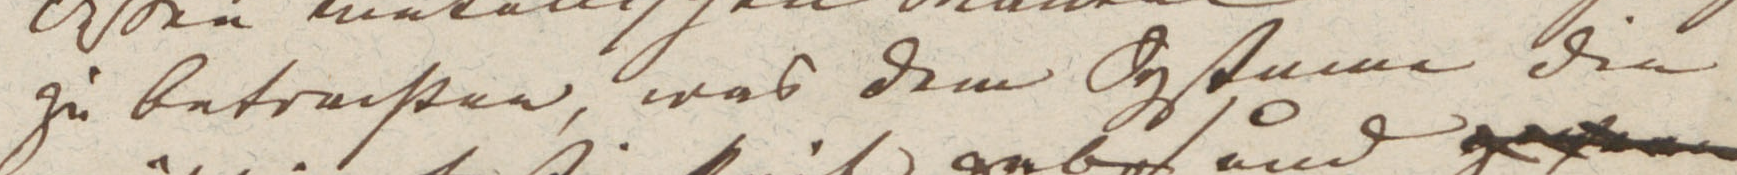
zu betrachten, was dem Systeme die
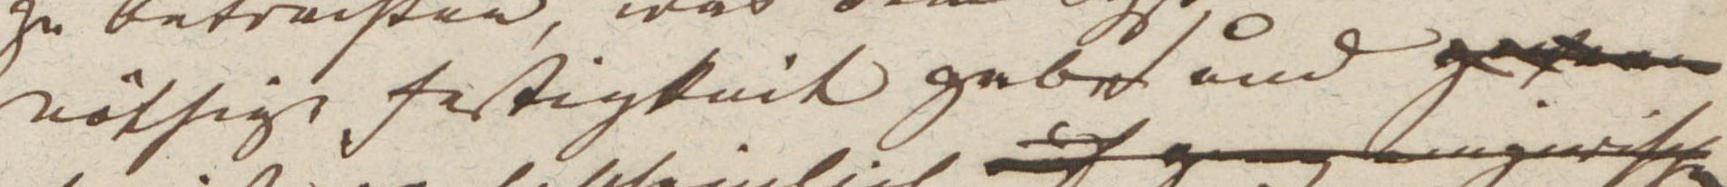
nöthige Festigkeit gaebe und gewan
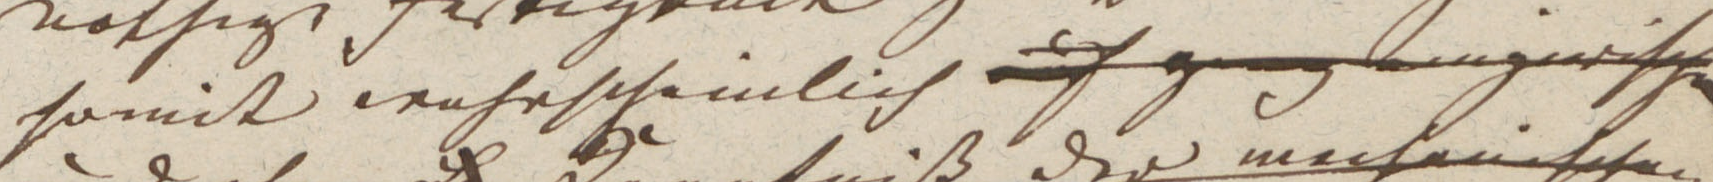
somit wahrscheinlich auf ganz empirischem
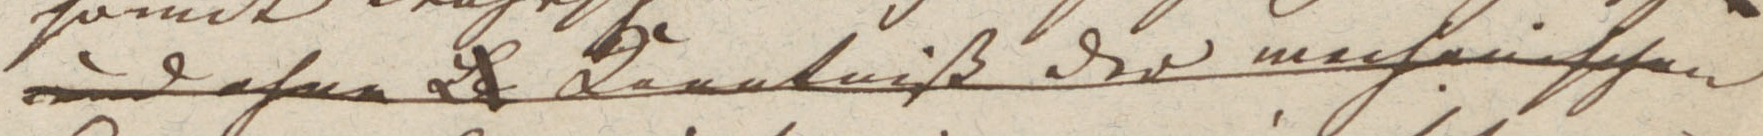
und ohne L Kenntniss der mechanischen
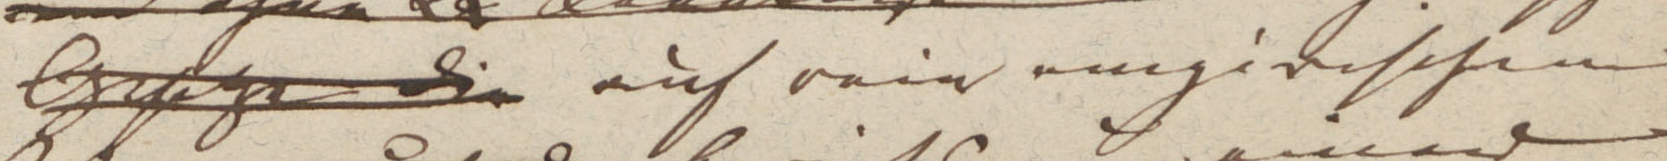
Gesetze die auf rein empirischem
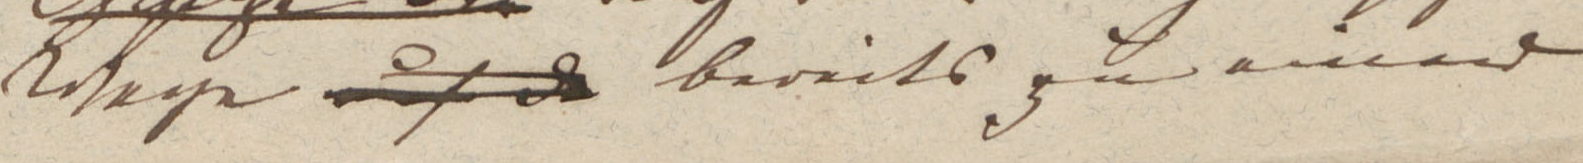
Wege auf d bereits zu einer
